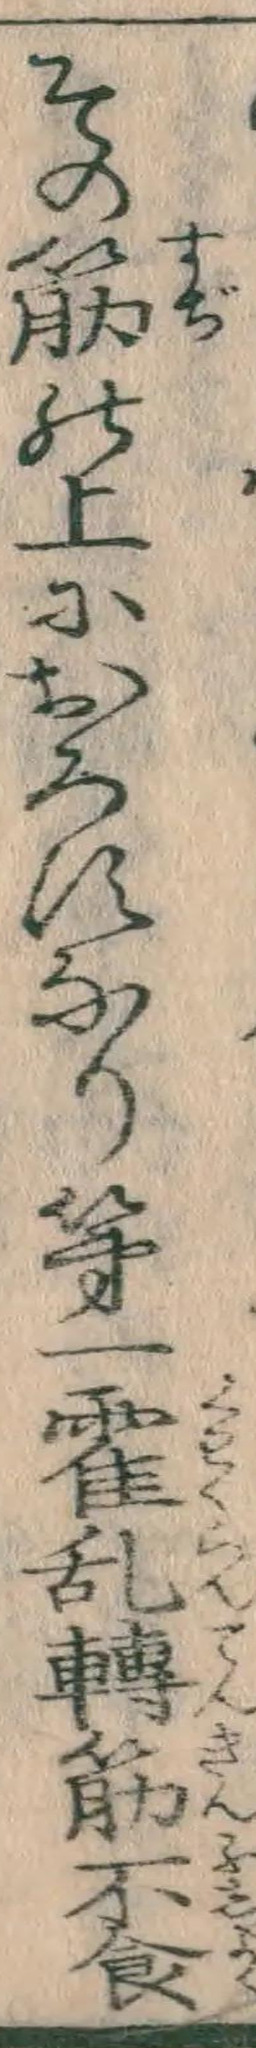その筋の上におろすなり第一霍乱転筋不食
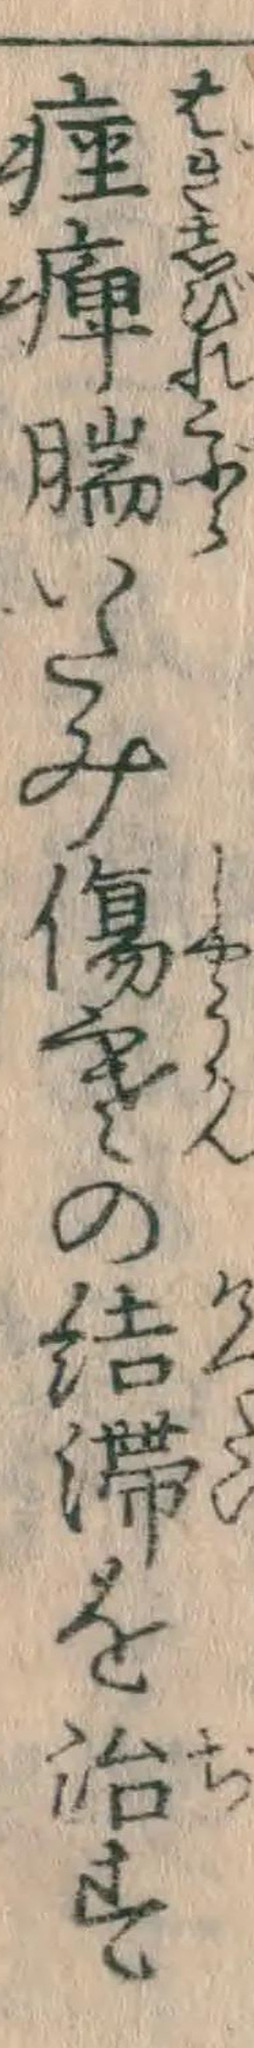痙痺腨いたみ傷寒の結滞を治す
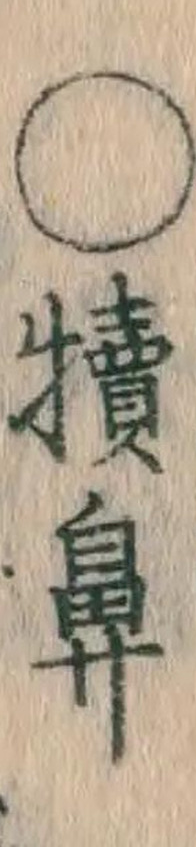○犢鼻
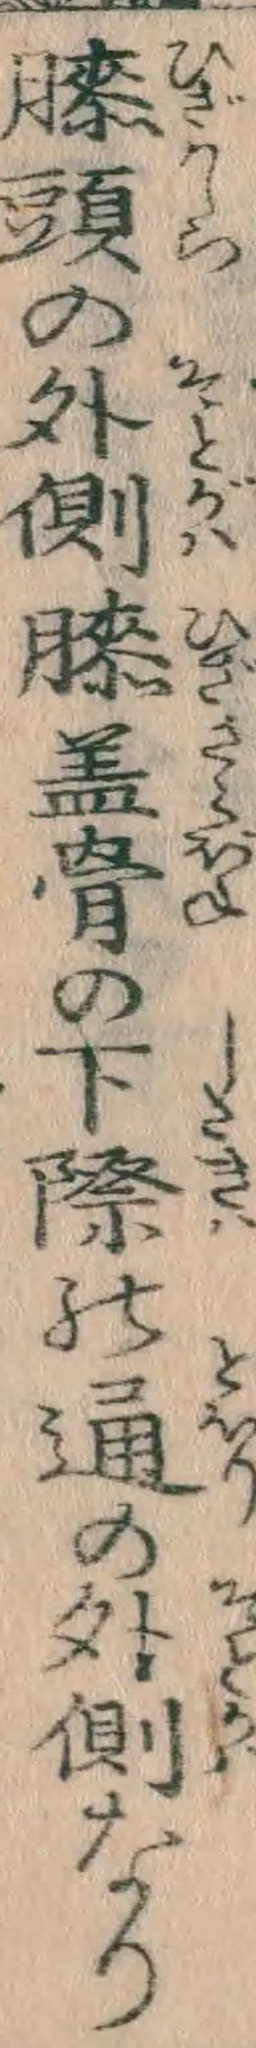膝頭の外側膝蓋骨の下際の通の外側なり
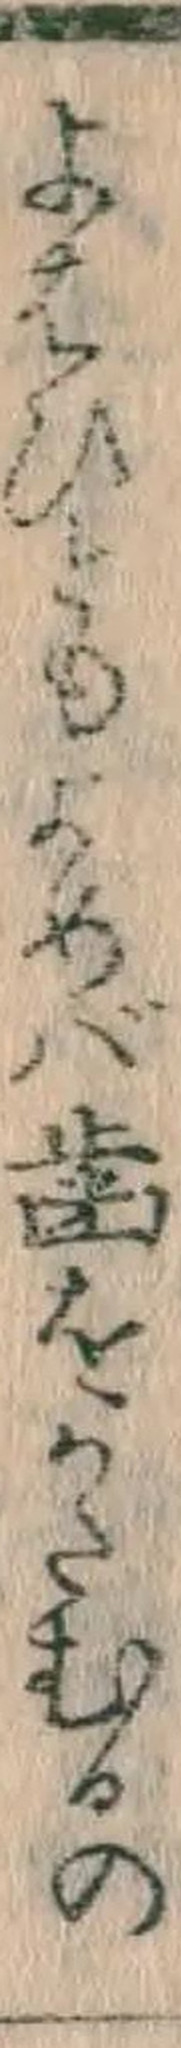よはひともよめば歯をかたむるの
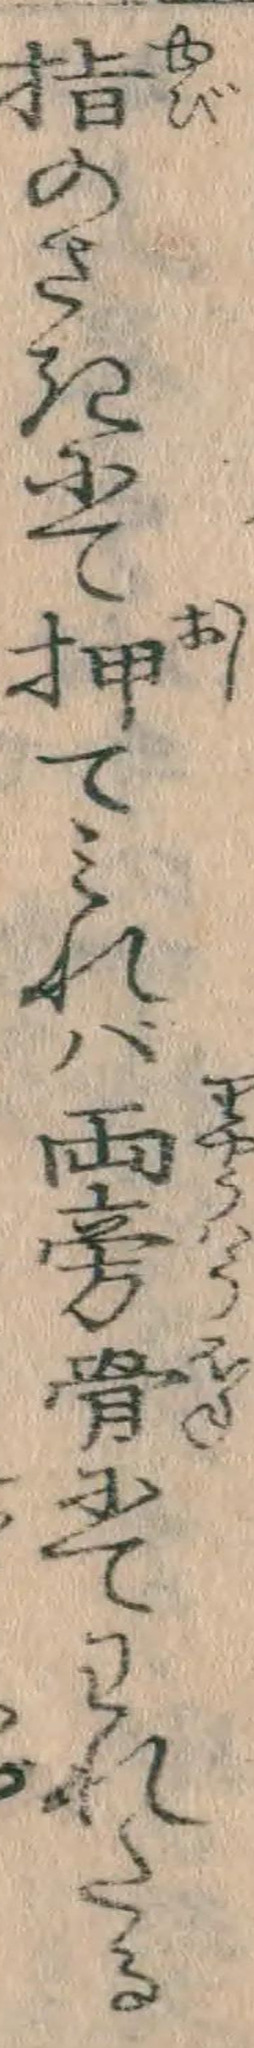指のさきにて押てみれば両旁骨にてわれたる
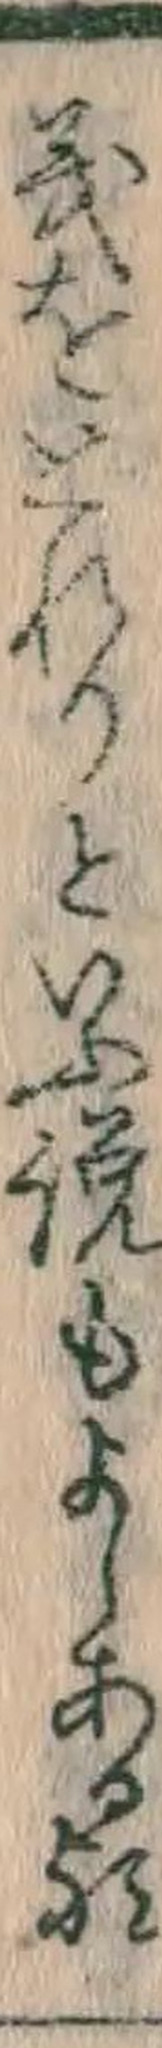義をとれりといふ説もよしある歟
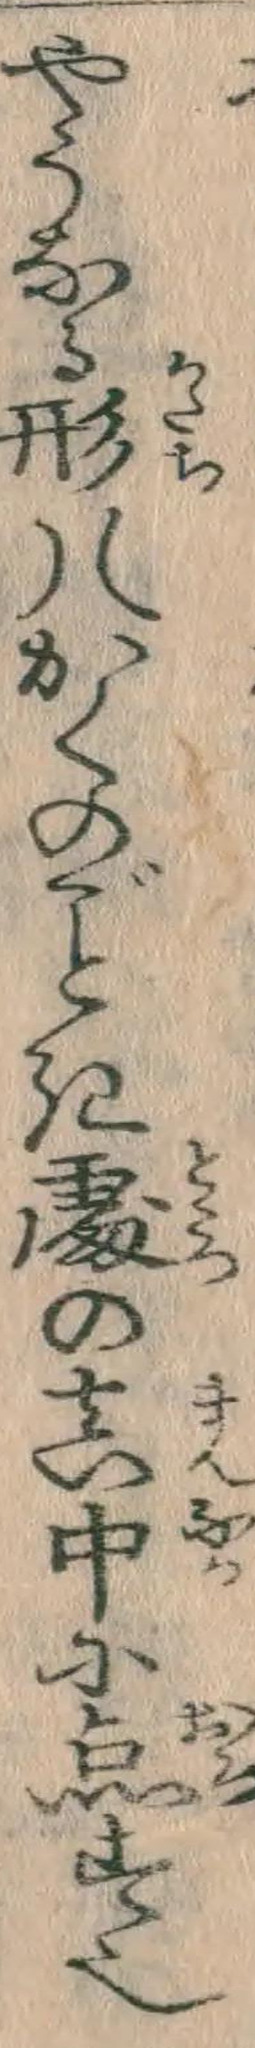やうなる形かくのごとき処の真中に点す也
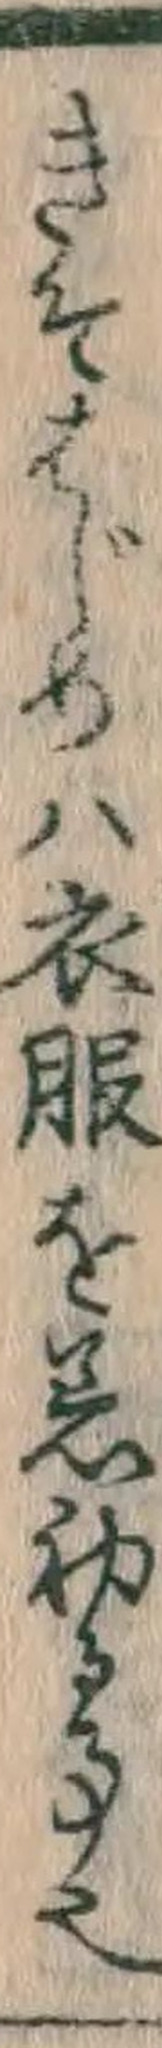きそはじめは衣服を着初る事也
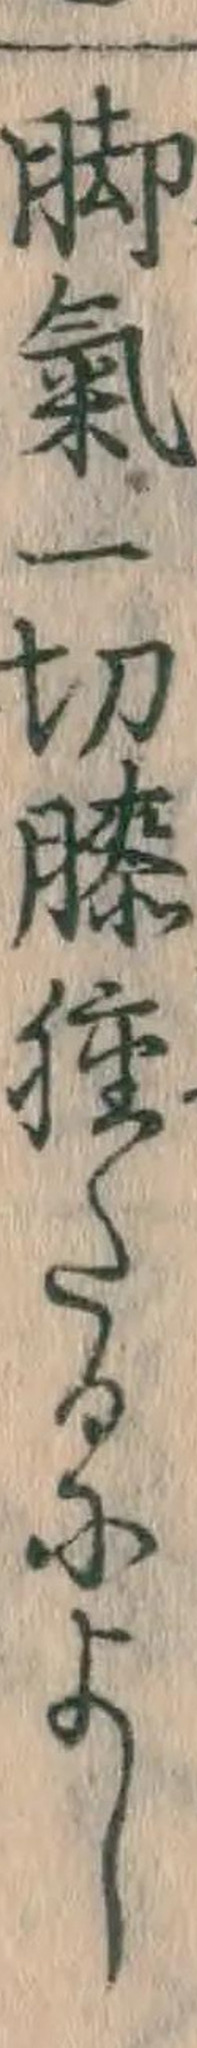脚気一切膝腫たるによし
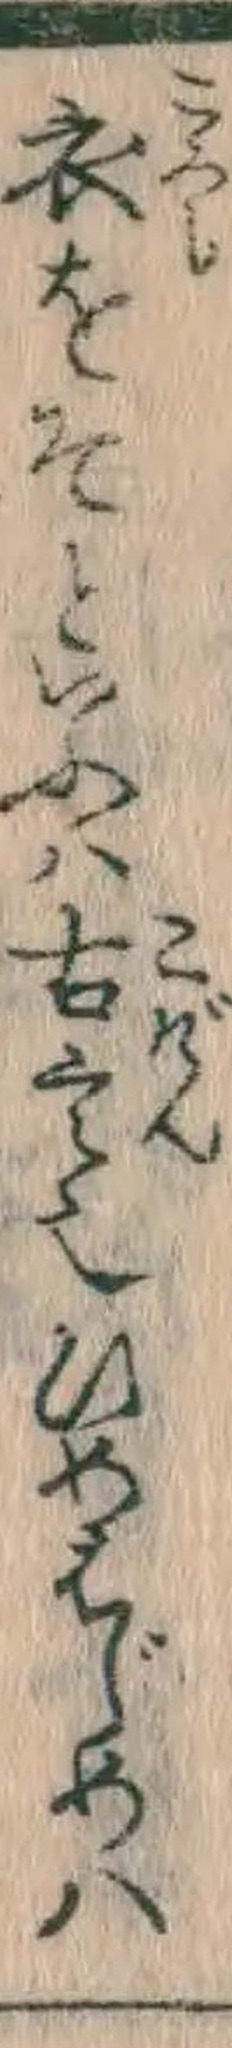衣をそといふは古言也ひめはじめは
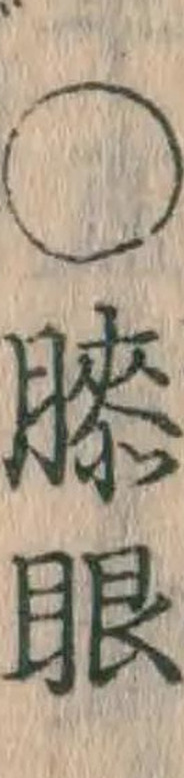○膝眼
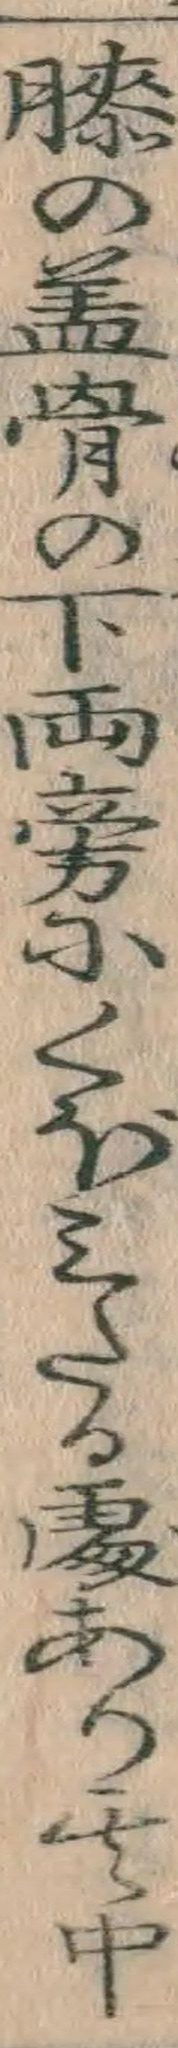膝の蓋骨の下両旁にくぼみたる処あり其中
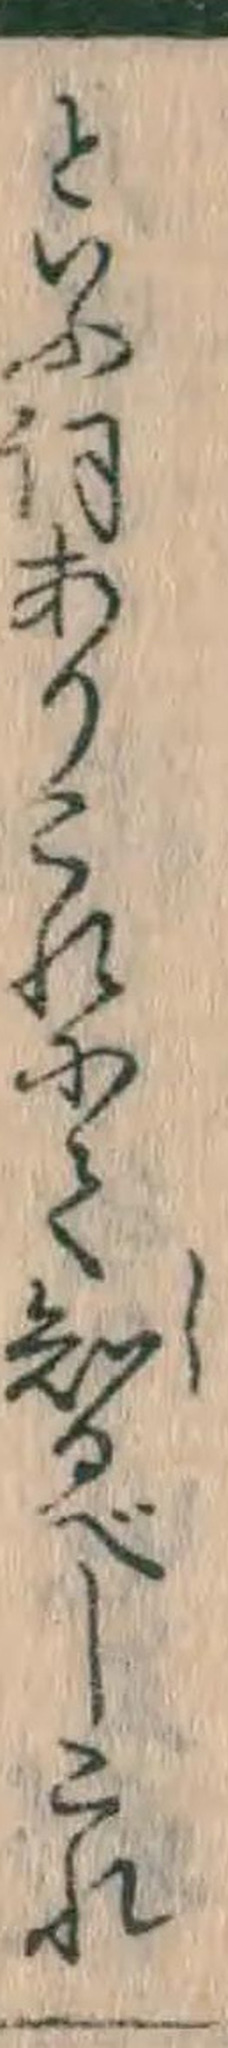といふ詞ありこれにて知るべしこれ
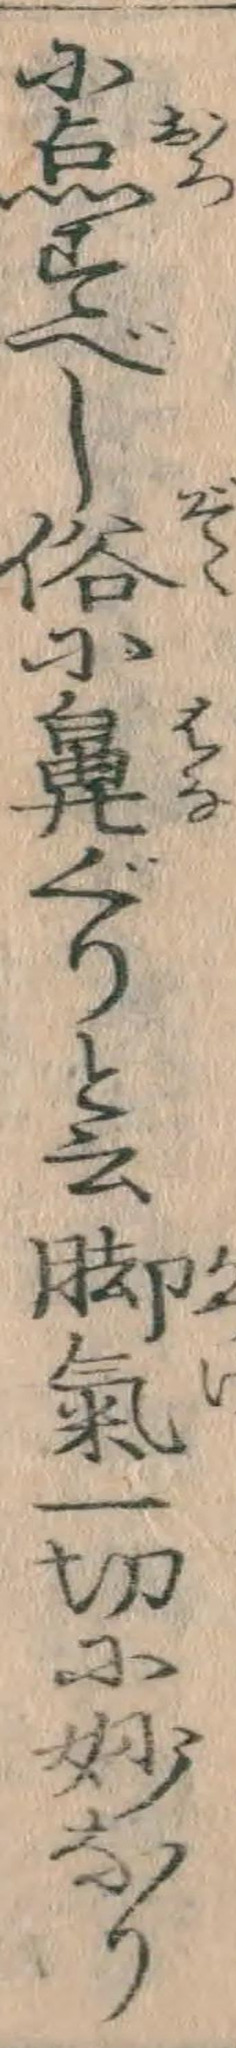に点すべし俗に鼻ぐりと云脚気一切に妙なり
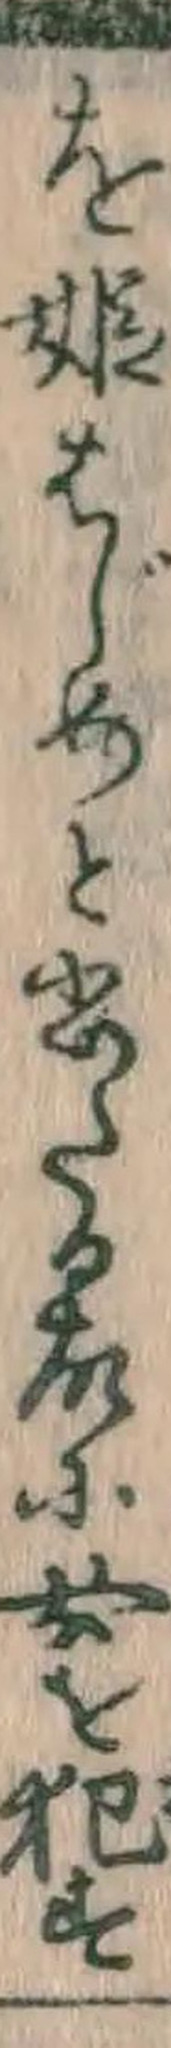を姫はじめと書たる故に女を犯す
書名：広益秘事大全 3巻. [4]
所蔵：国立国会図書館 National Diet Library, JAPAN
